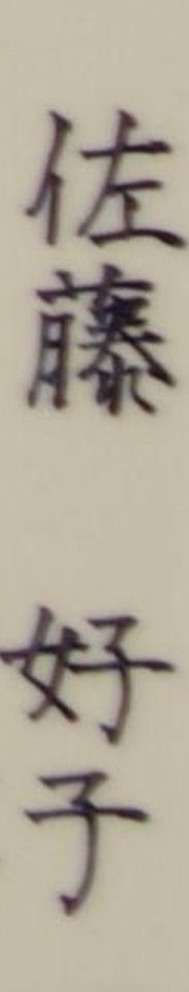佐藤好子
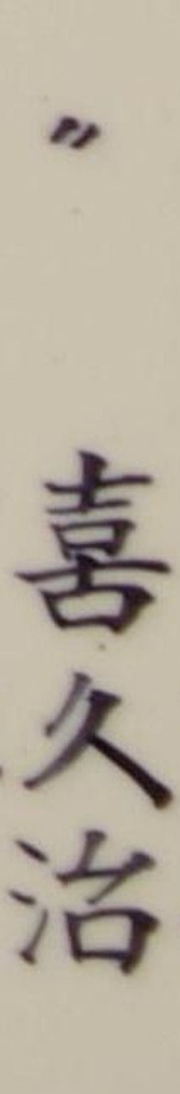喜久治
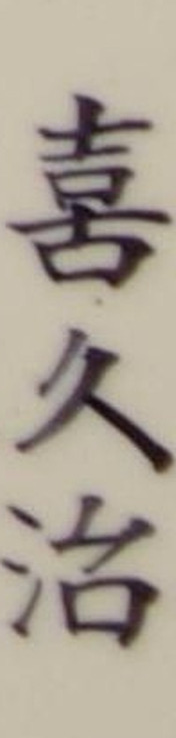喜久治
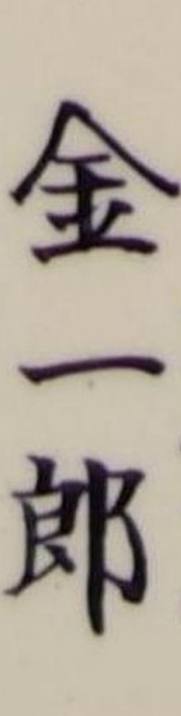金一郎
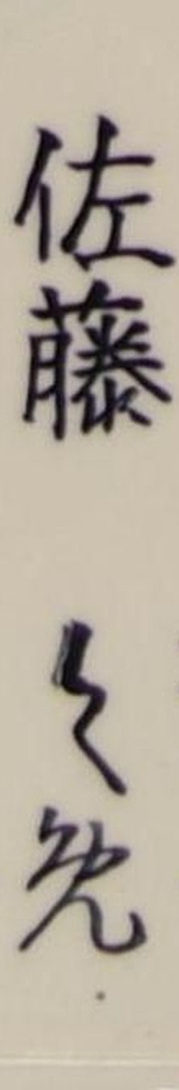佐藤くめ
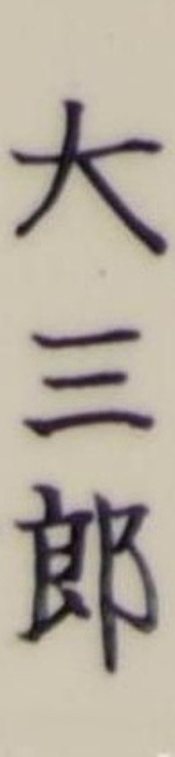大三郎
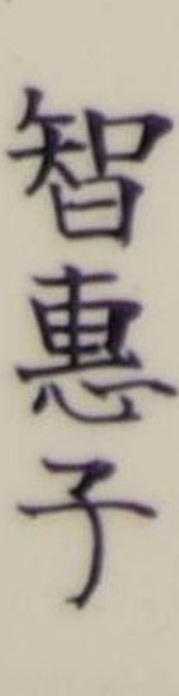智恵子

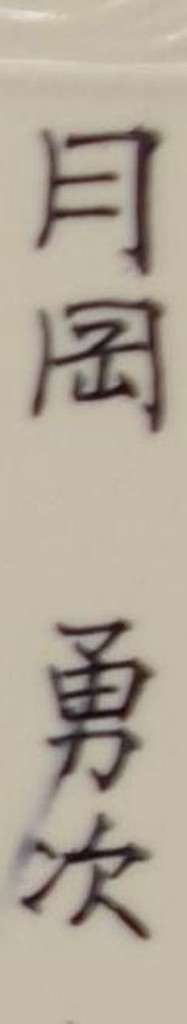月岡勇次
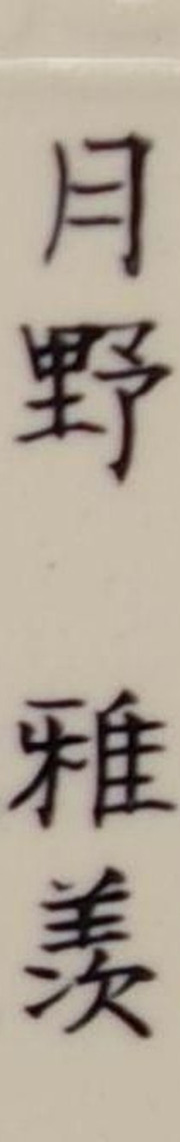月野雅羨
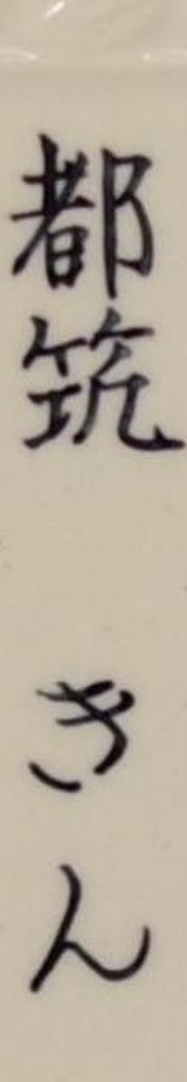都筑きん
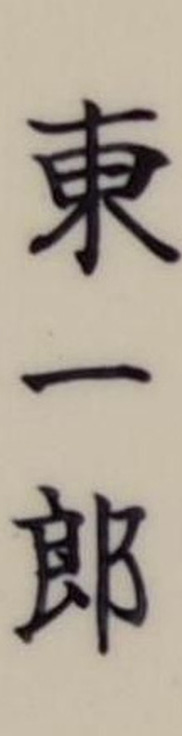東一郎
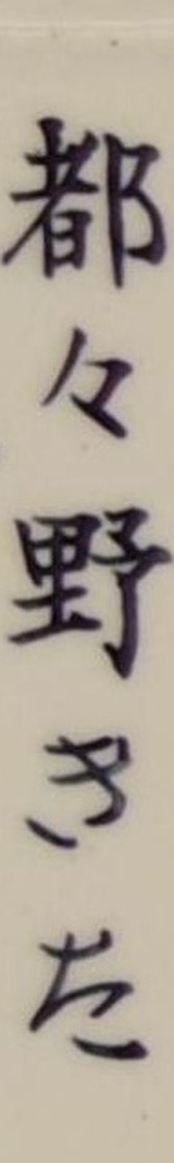都々野きた

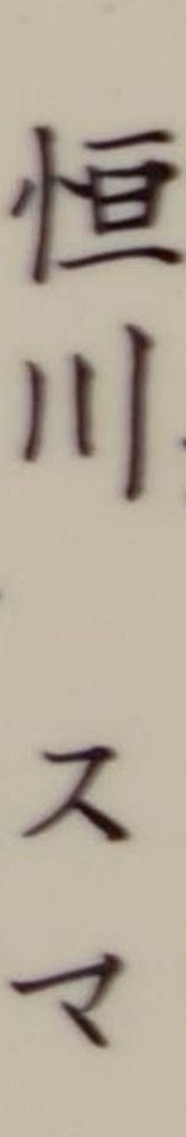恒川スマ
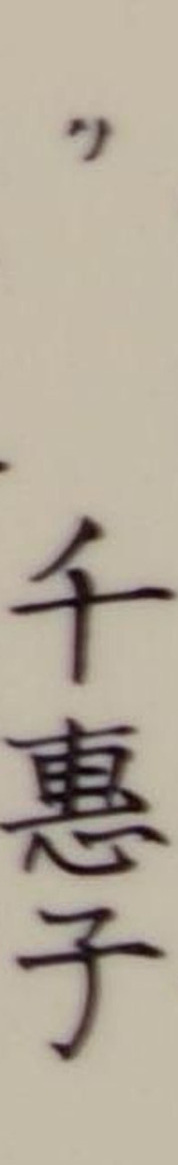千恵子
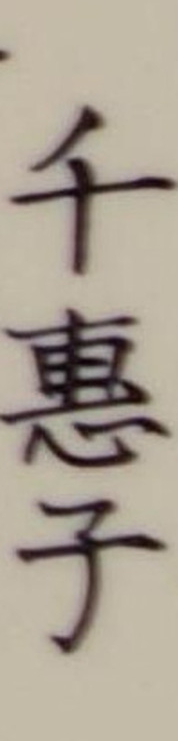千恵子
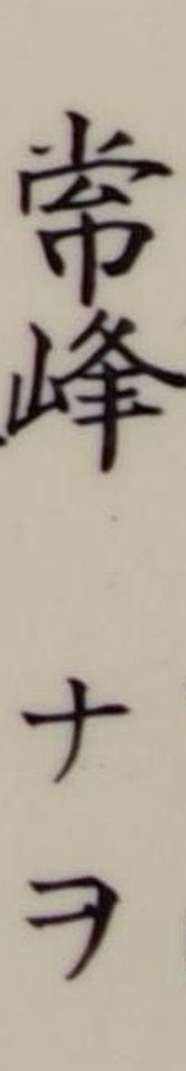常峰ナヲ
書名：E~L
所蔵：高野山金剛峯寺
